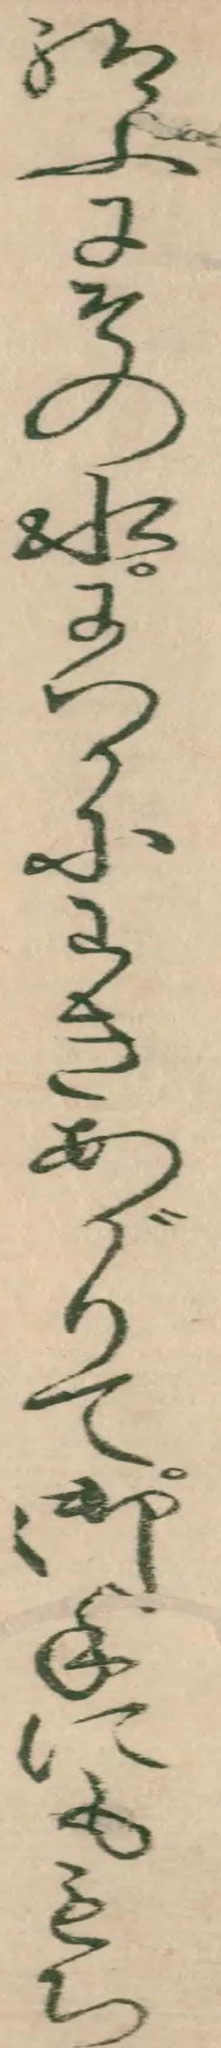給ふにその水。にはかにわきあがりて。御手にももち
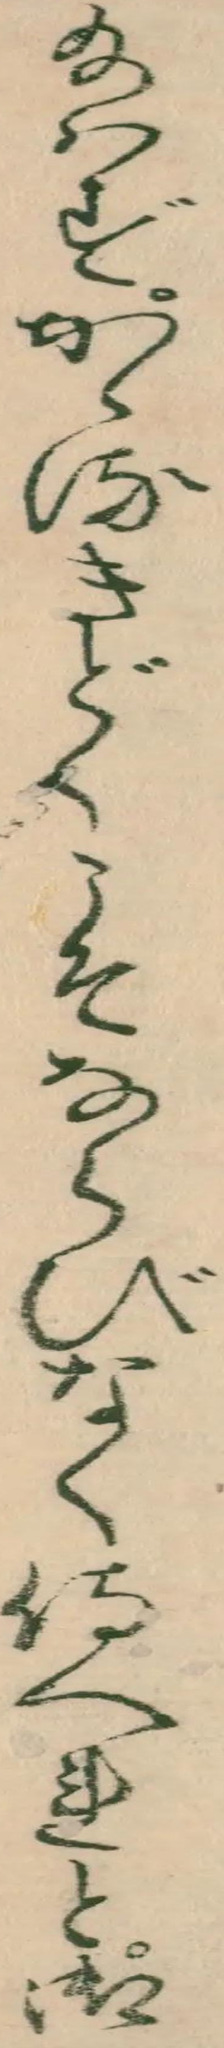給はず。かゝるきどくこそならびなく侍へれと。御
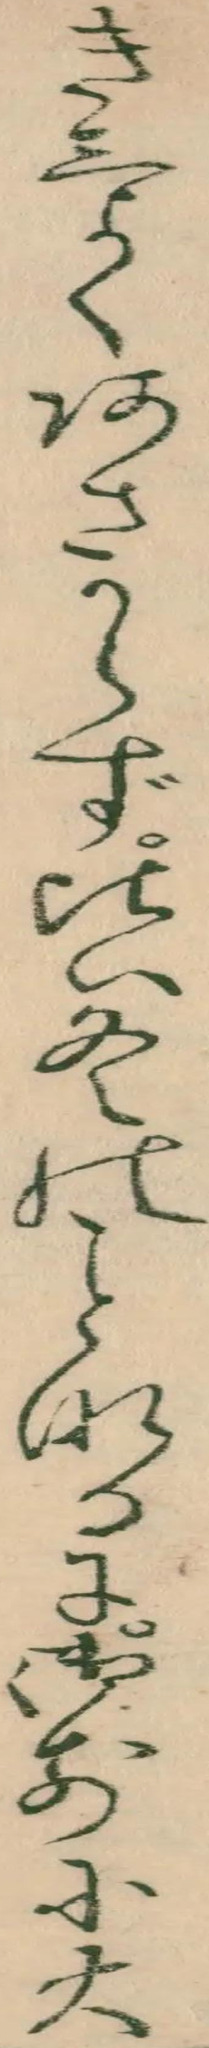きしよく。あさからず。頃は冬のことなるに。御前に大
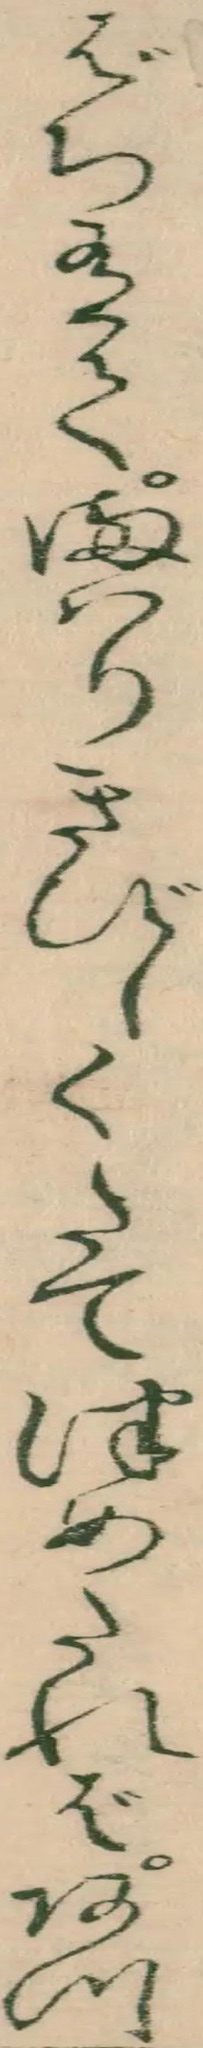ばち有て。まはりきびしくたてつめたれば。あつ
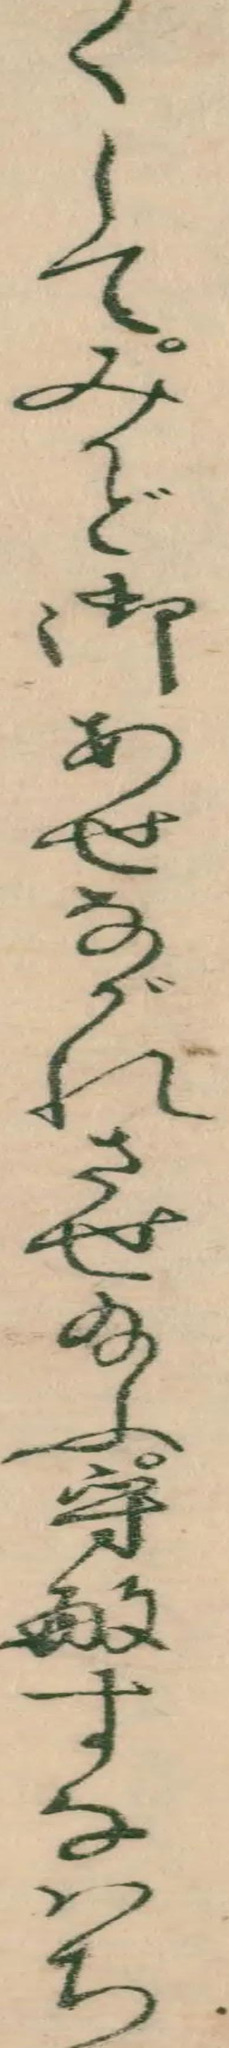くして。みかど御あせながれさせ給ふ。守敏すなはち
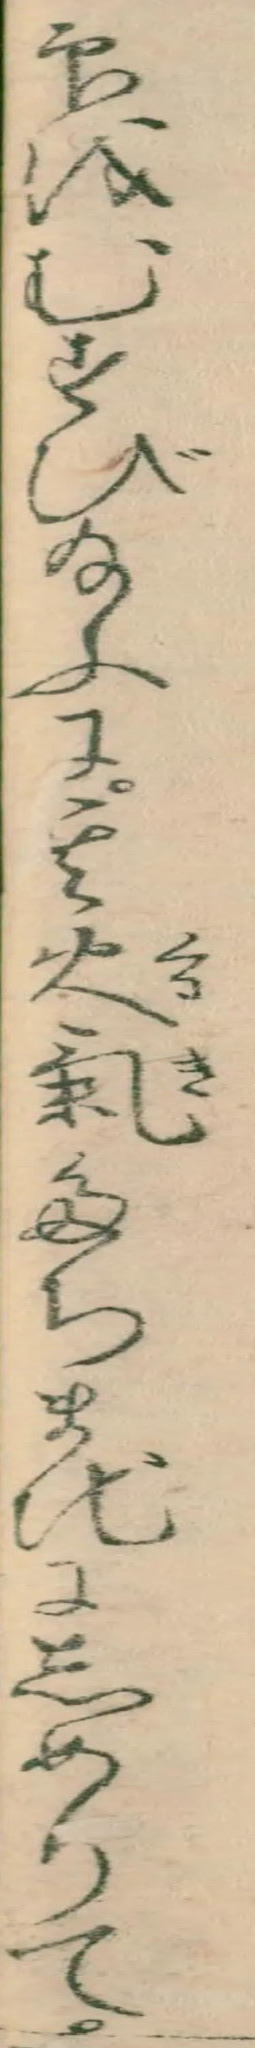印をむすび給ふに。其火気たちまちにしめりて。
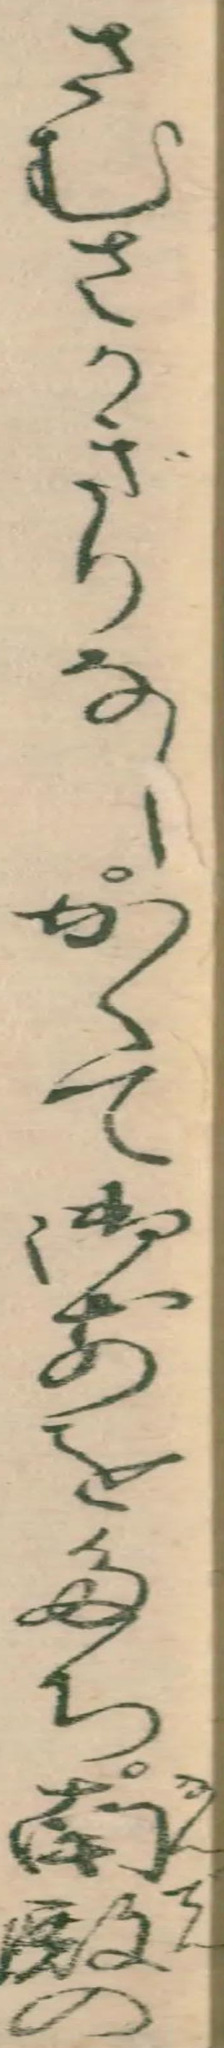さむさかぎりなし。かくて御前をたち。南殿の
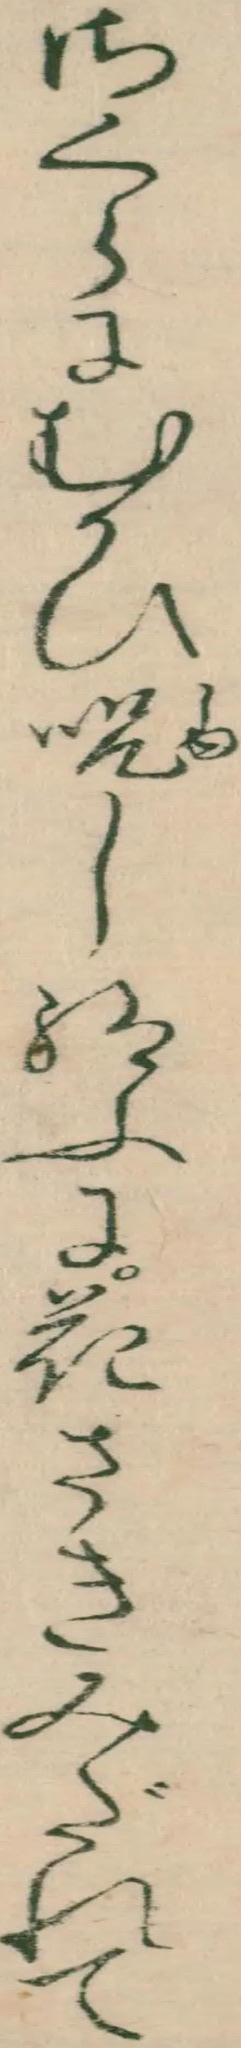さくらにむかひ呪し給ふに。花さきみだれて
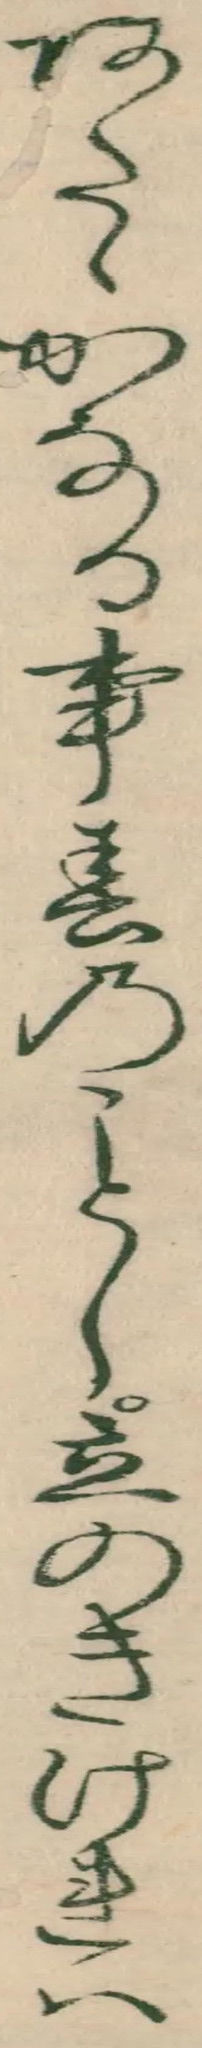あたゝかなる事春のことし。立のきけれは
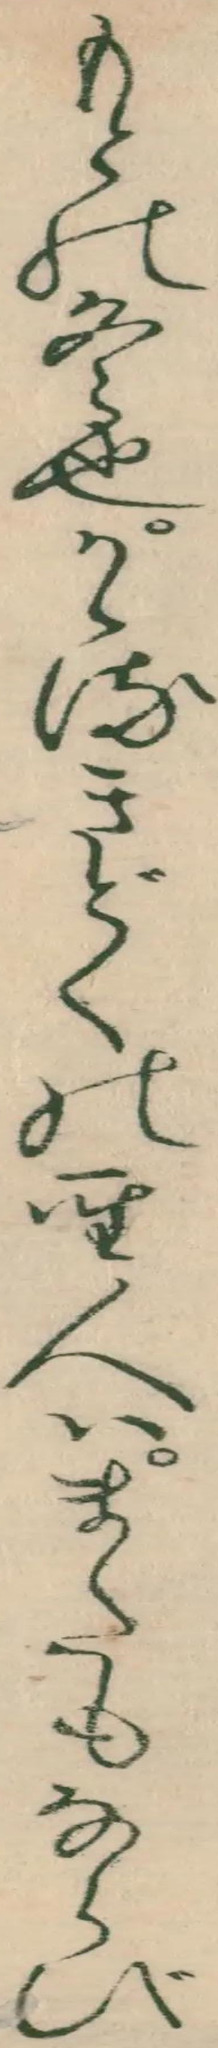もとの冬也。かゝるきどくの聖人は。またもならび
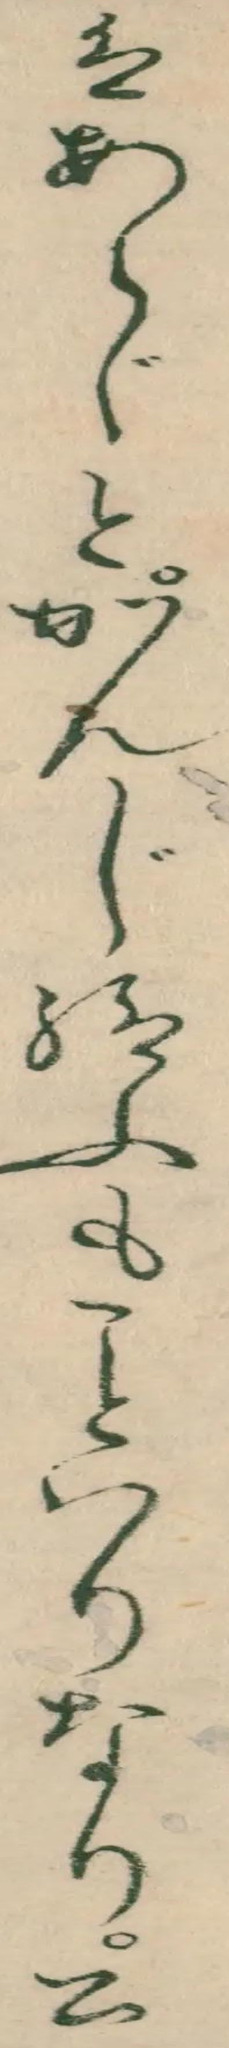はあらじと。かんじ給ふもことはりなり。公
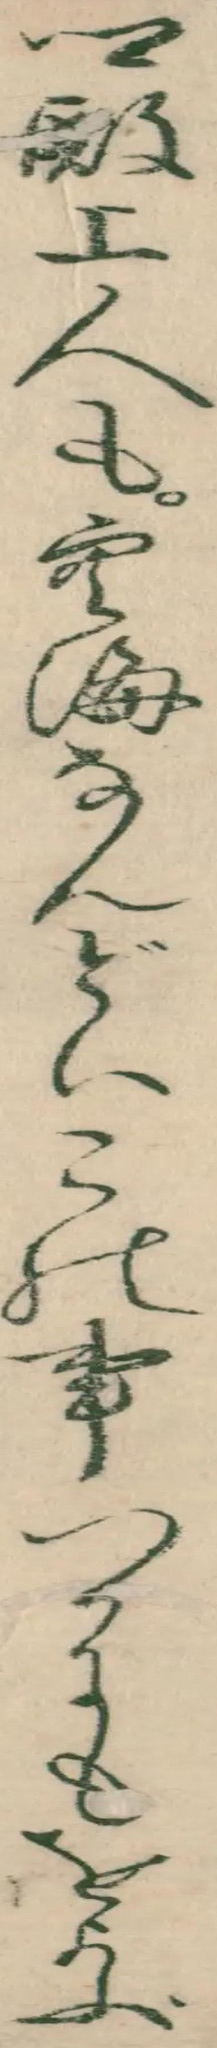卿殿上人も。空海なんどはこの事つかにもをよぶ
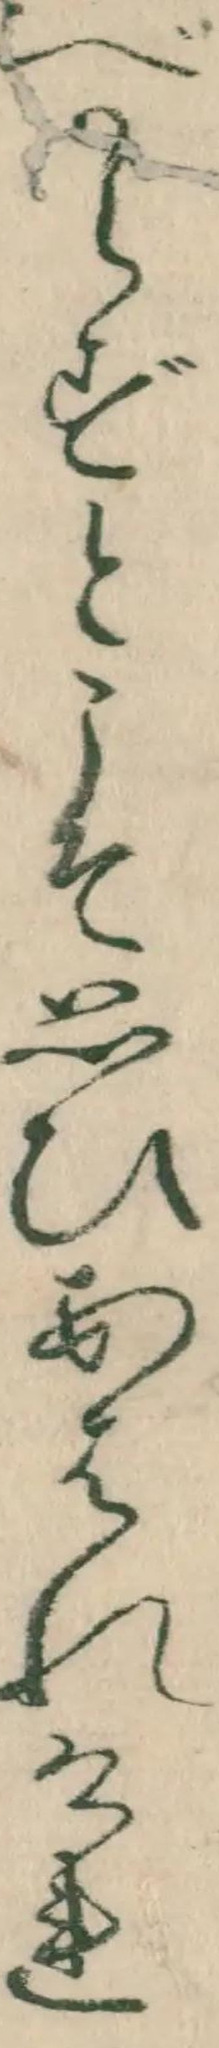べからずとこそ思ひあはれけれ

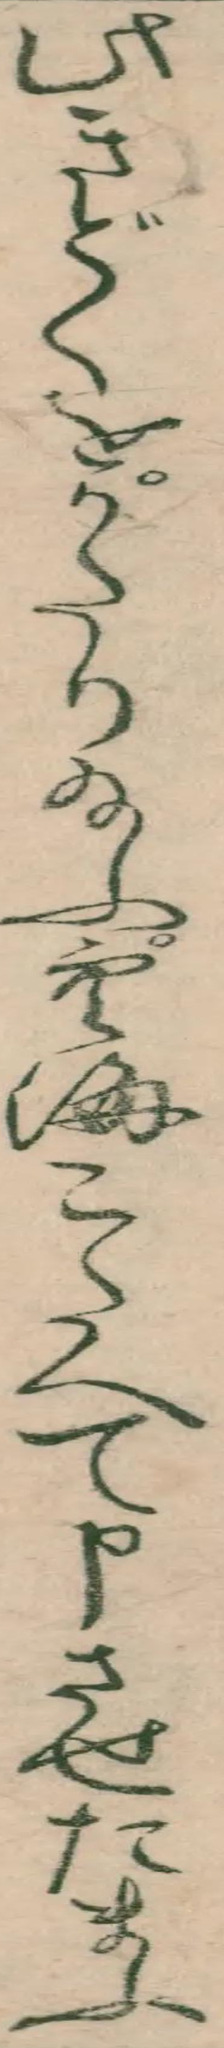此きどくを。かたり給ふ。空海こたへて申させたまふ
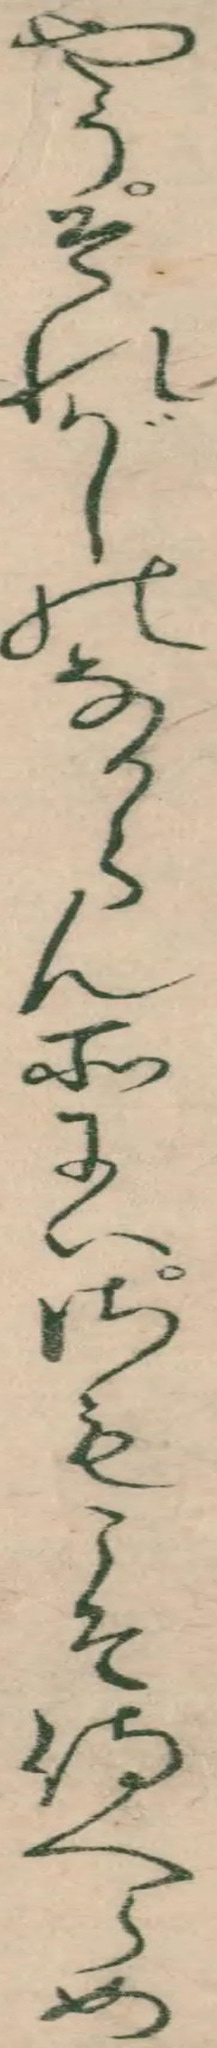やう。それがしのなからん所には。さもこそ侍へらめ
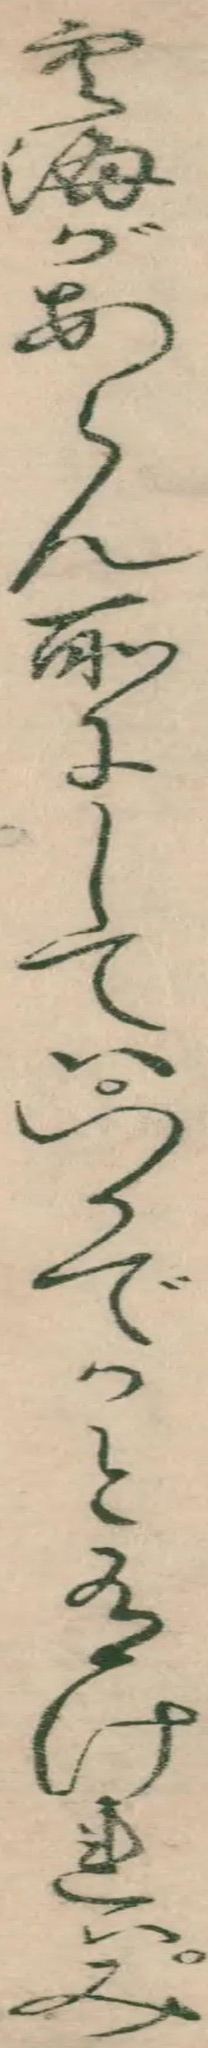空海があらん所にしては。いかでかと有けれは。み
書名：弘法大師御本地 3巻. [2]
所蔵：国立国会図書館 National Diet Library, JAPAN
